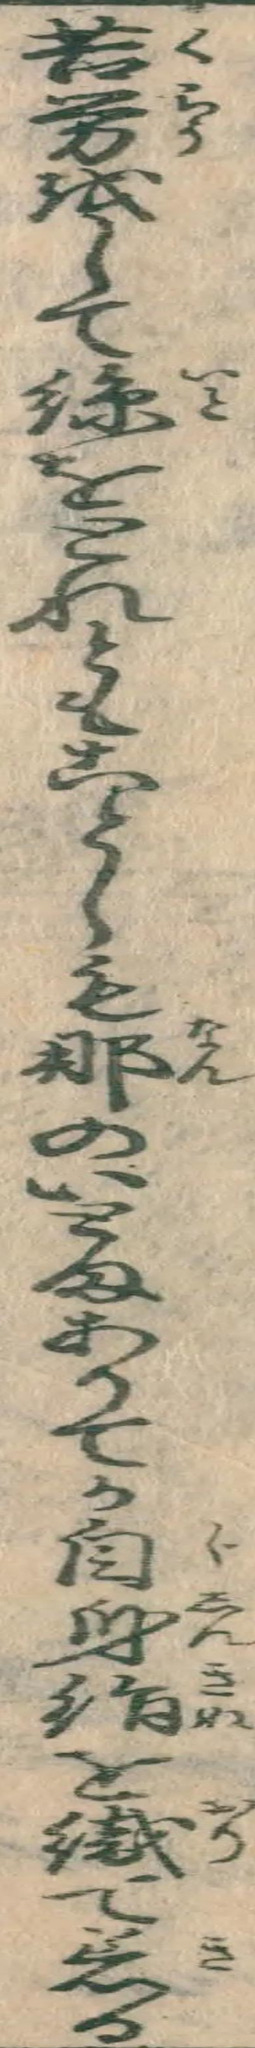苦労をして糸をとれともことしも那のいとまありてか自身絹を織て着る
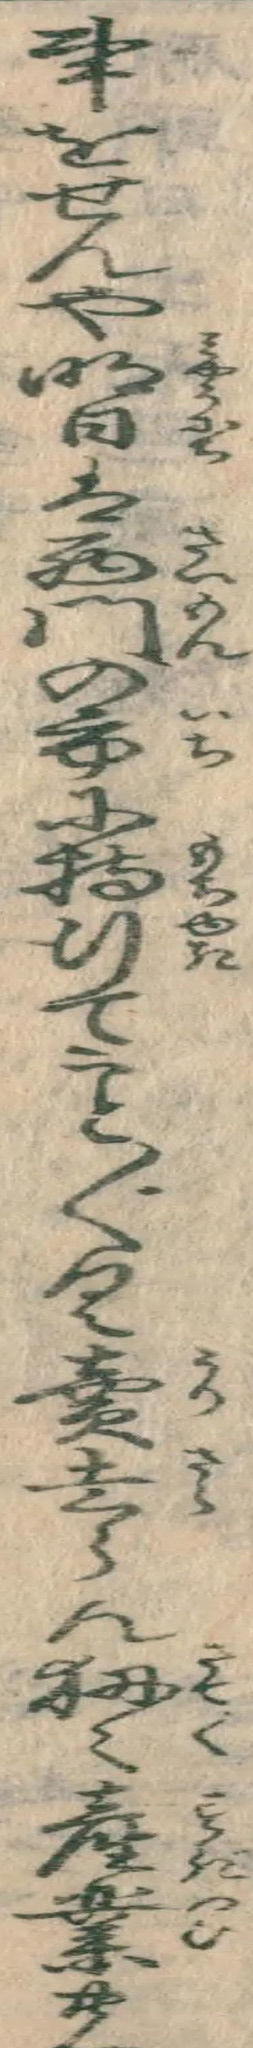事をせんや明日は西門の市に持行てこと〴〵く売去らん扨々産業の
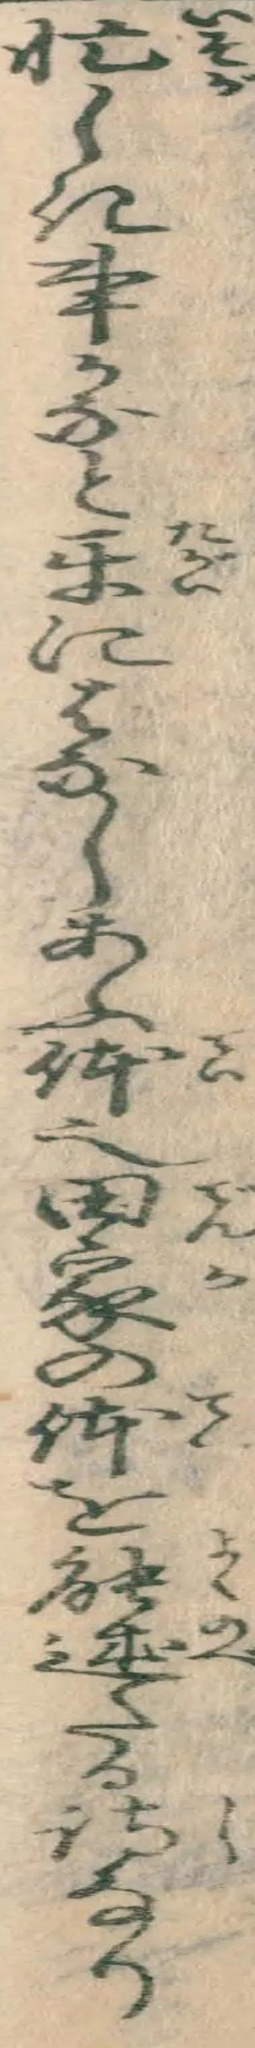忙しき事かなと互にはなしあふ体也田家の体を能述たる詩なり
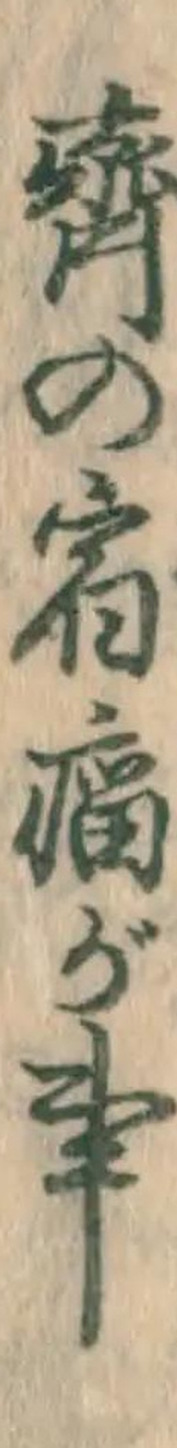斉の宿瘤が事
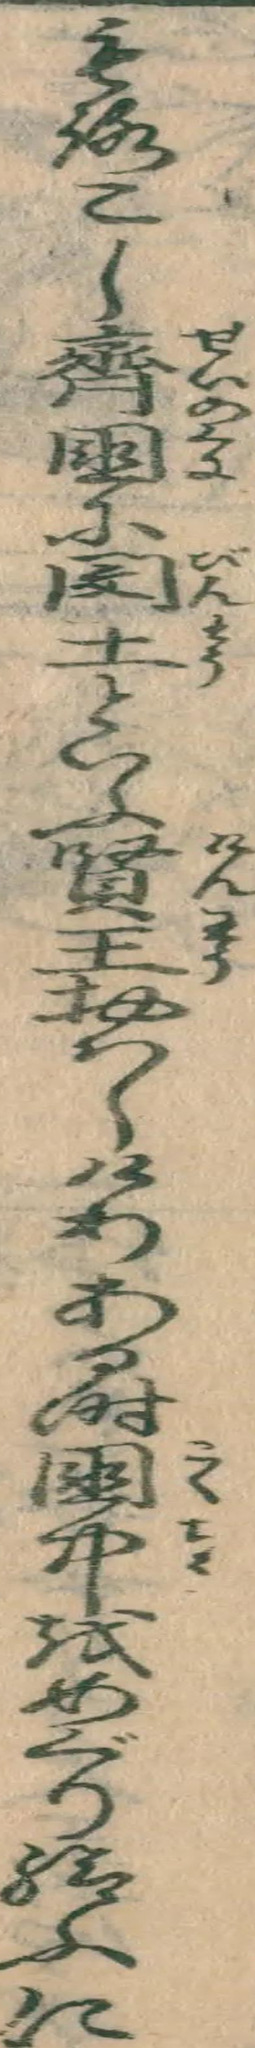もろこし斉国に閔王といふ賢王おはしけりある時国中をめぐり給ふに
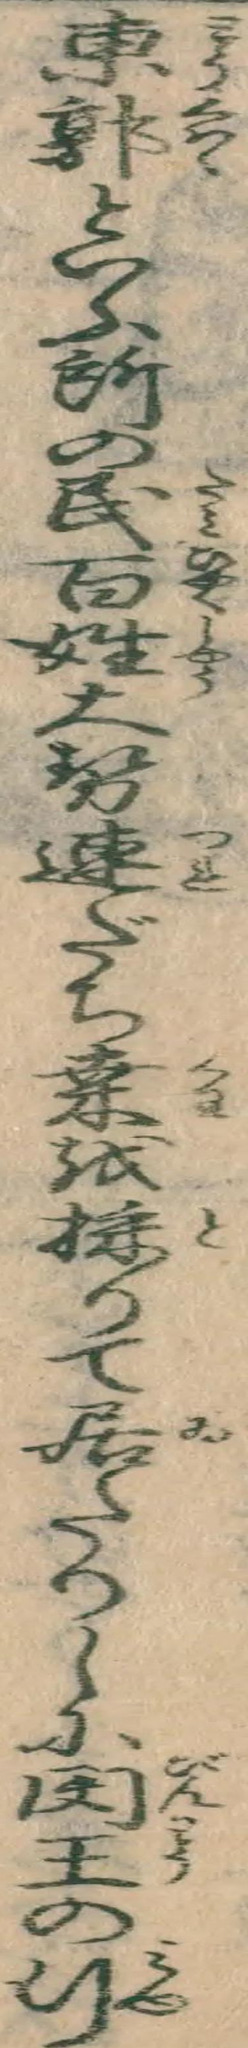東郭といふ所の民百姓大勢連だち桑を採りて居たりしに閔王の行
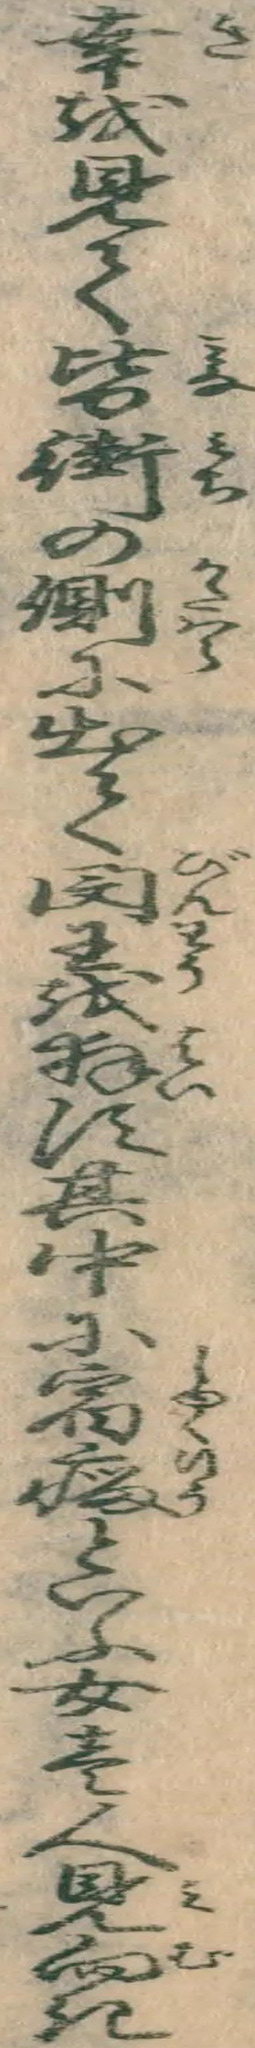幸を見て皆街の側に出て閔王を拝す其中に宿瘤といふ女壱人見向き
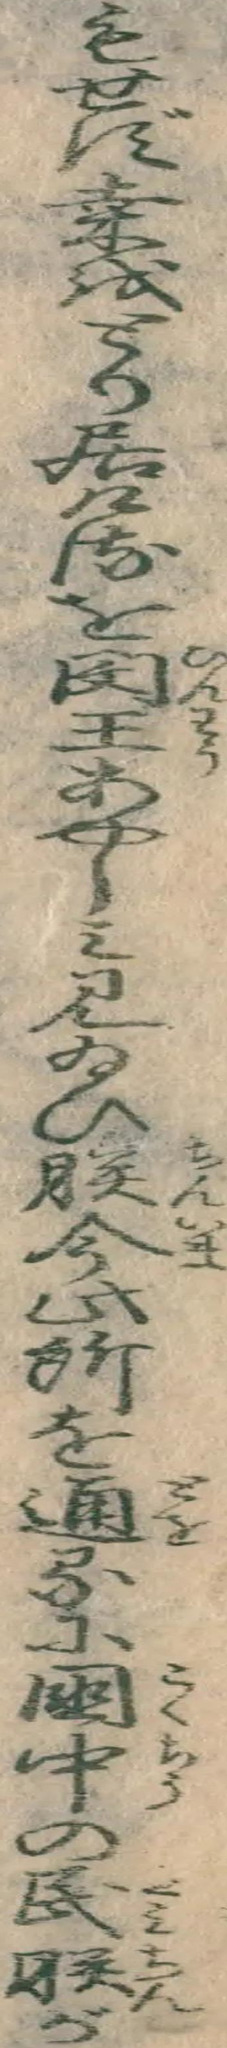もせず桑をとり居けるを閔王あやしみ見給ひ朕今此所を通るに国中の民朕が
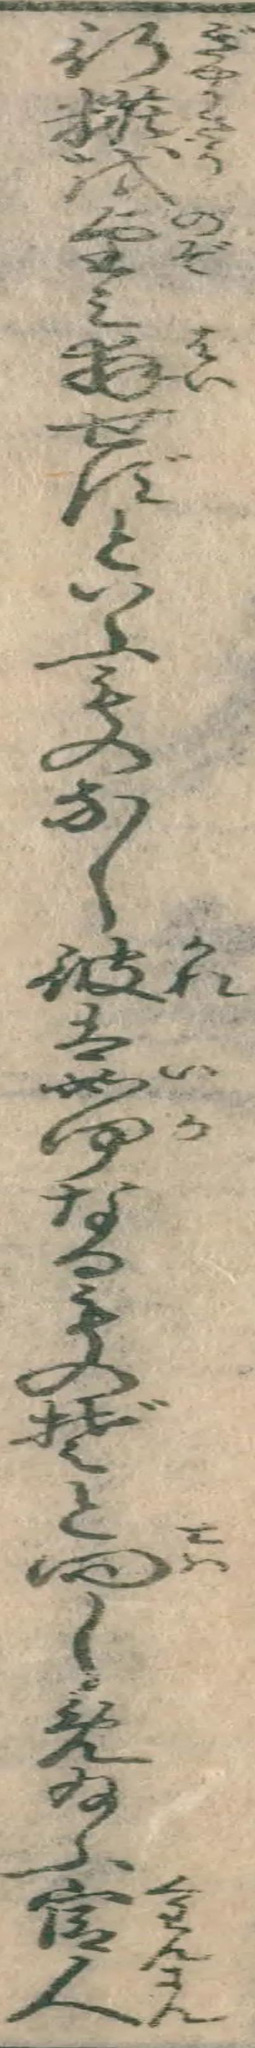行粧を望み拝せずといふものなし彼は如何なるものぞと問しめ給ふ官人
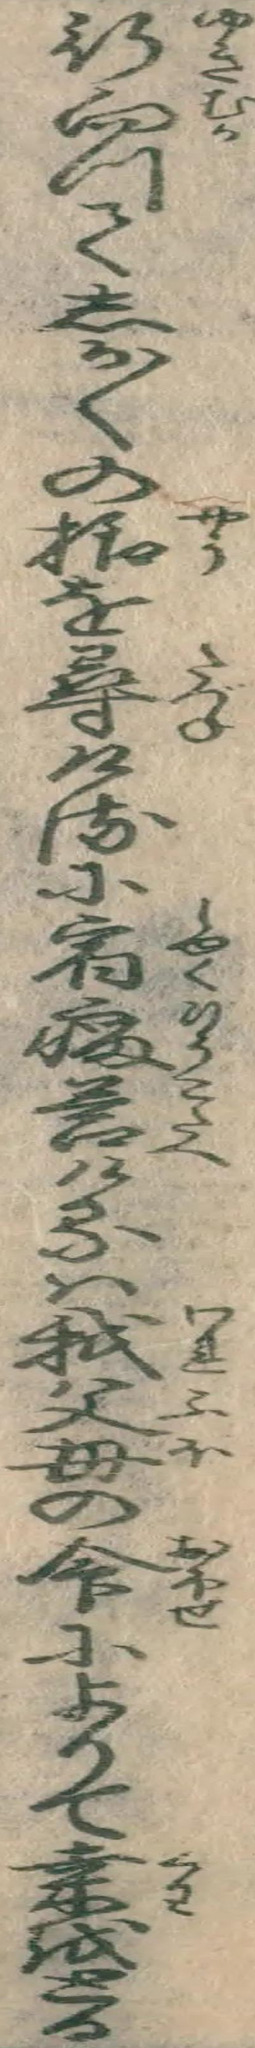行向つてしか〳〵の様を尋けるに宿瘤答けるは我父母の命によりて桑をとる
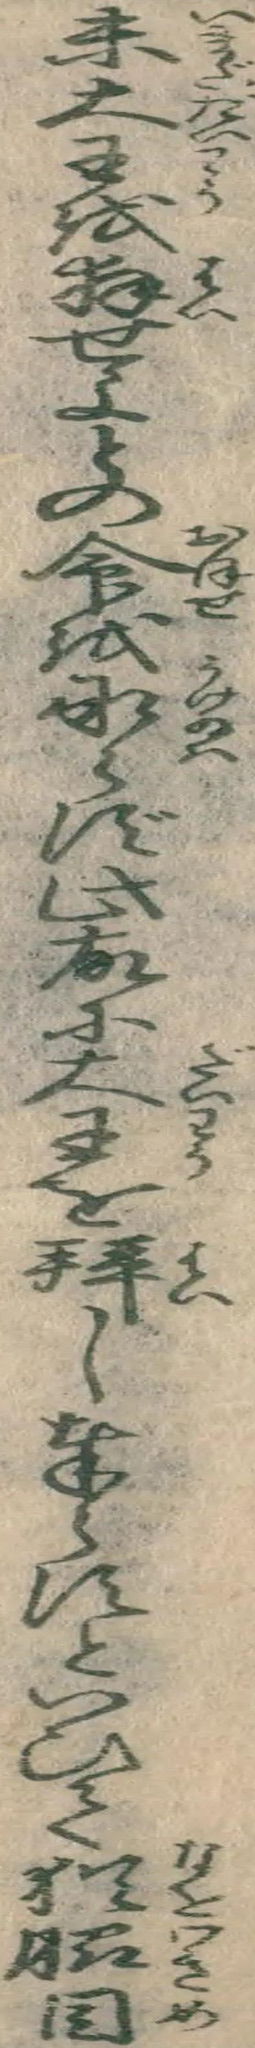未大王を拝せよとの命を承らず此故に大王を拝し奉らすといひて猶脇目
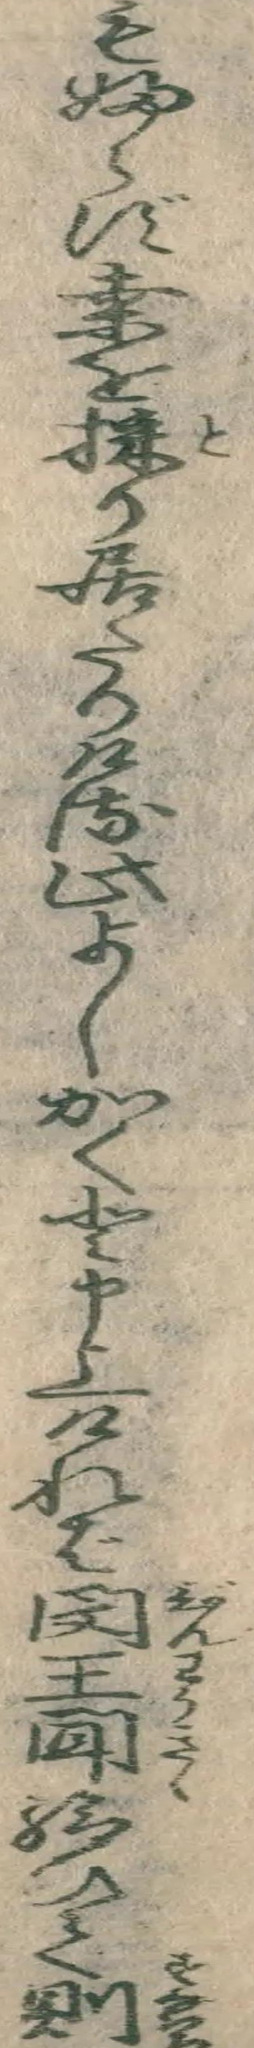もふらず桑を採り居たりける此よしかくと申上ければ閔王聞給ひて則
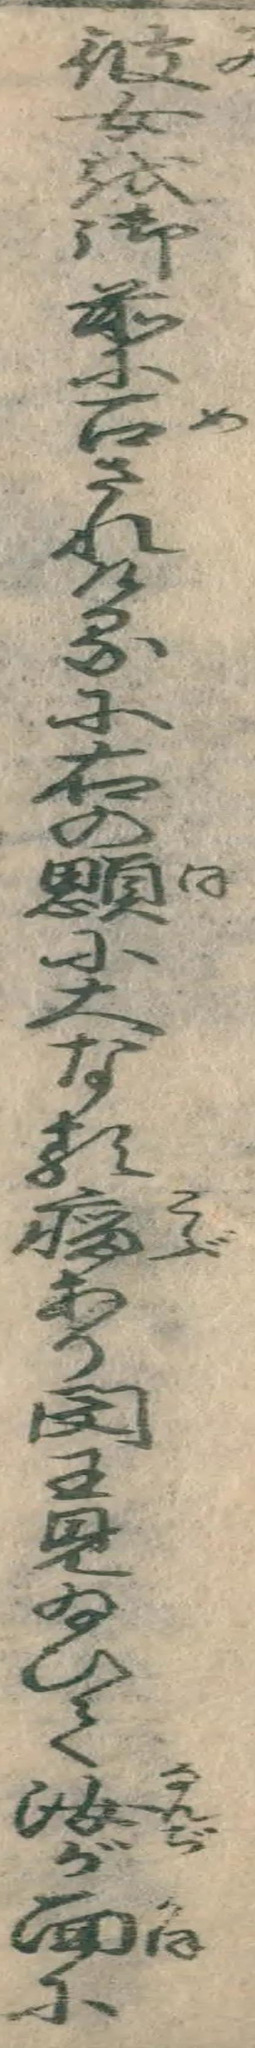彼女を御前に召されけるに右の顋に大なる瘤あり閔王見給ひて汝が面に
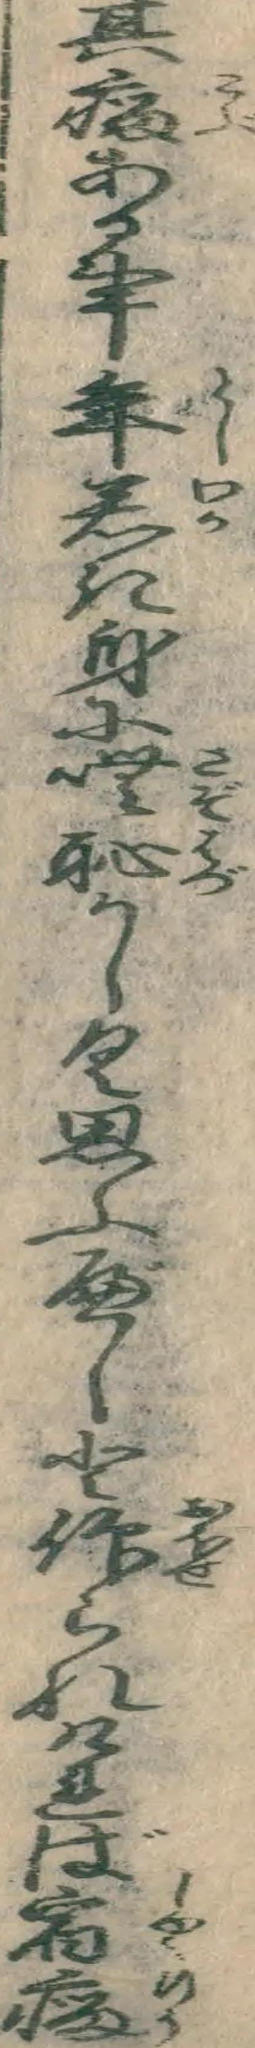ある事年若き身に嘸恥かしく思ふべしと仰られければ宿瘤

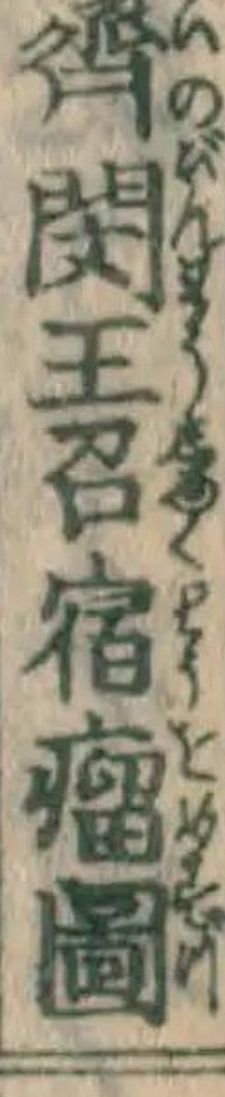斉閔王召宿瘤図
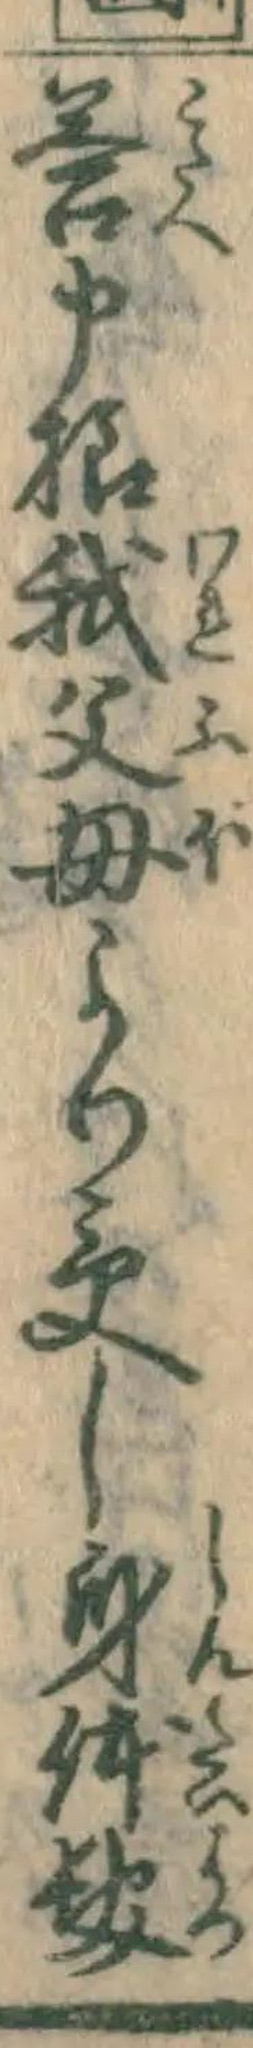答申様我父母より受し身体
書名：養蚕秘録 3巻. [3]
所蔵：国立国会図書館 National Diet Library, JAPAN
